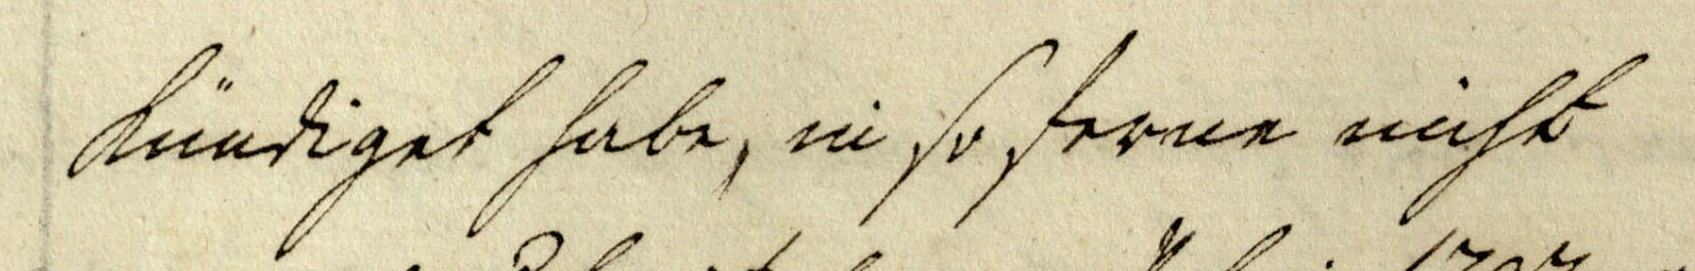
kündiget habe, in so ferne nicht
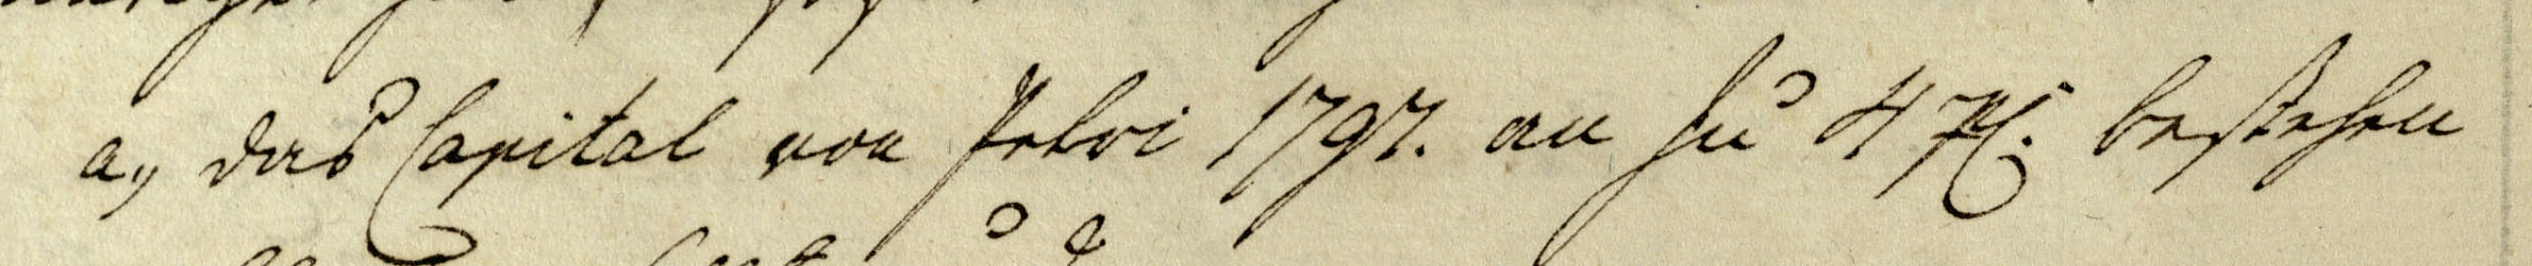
a, das Capital von Petri 1797. an zu 4 pl. bestehen
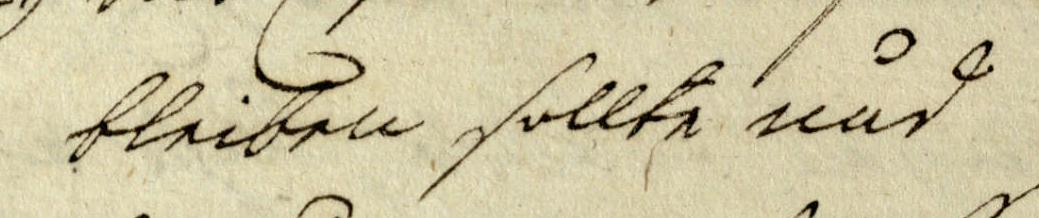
bleiben sollte und
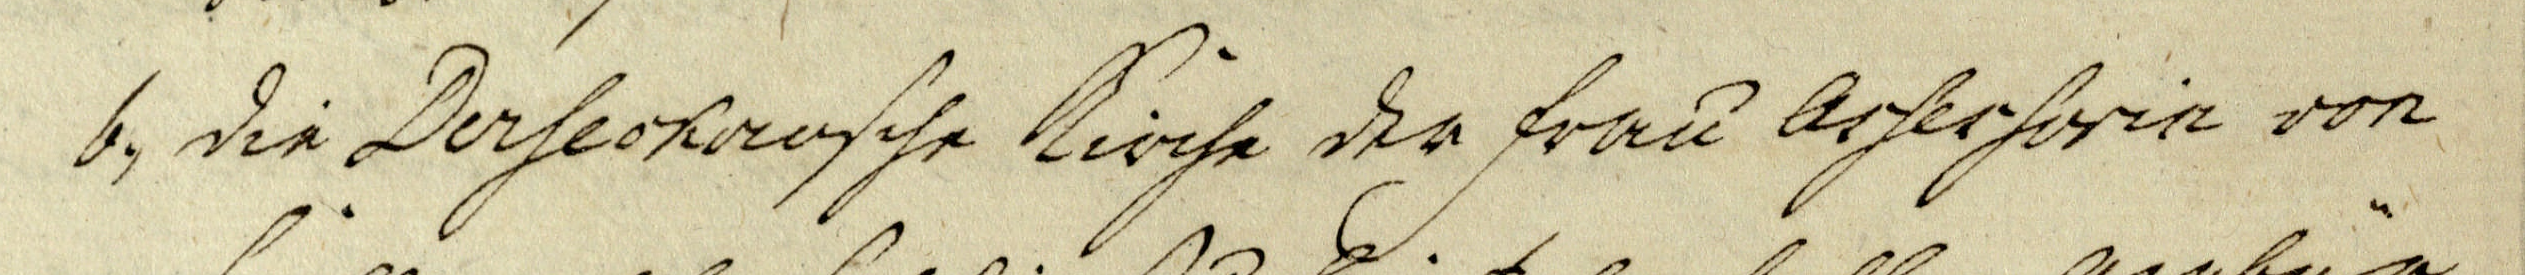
b., die Derseckowsche Kirche der Frau Assessorin von
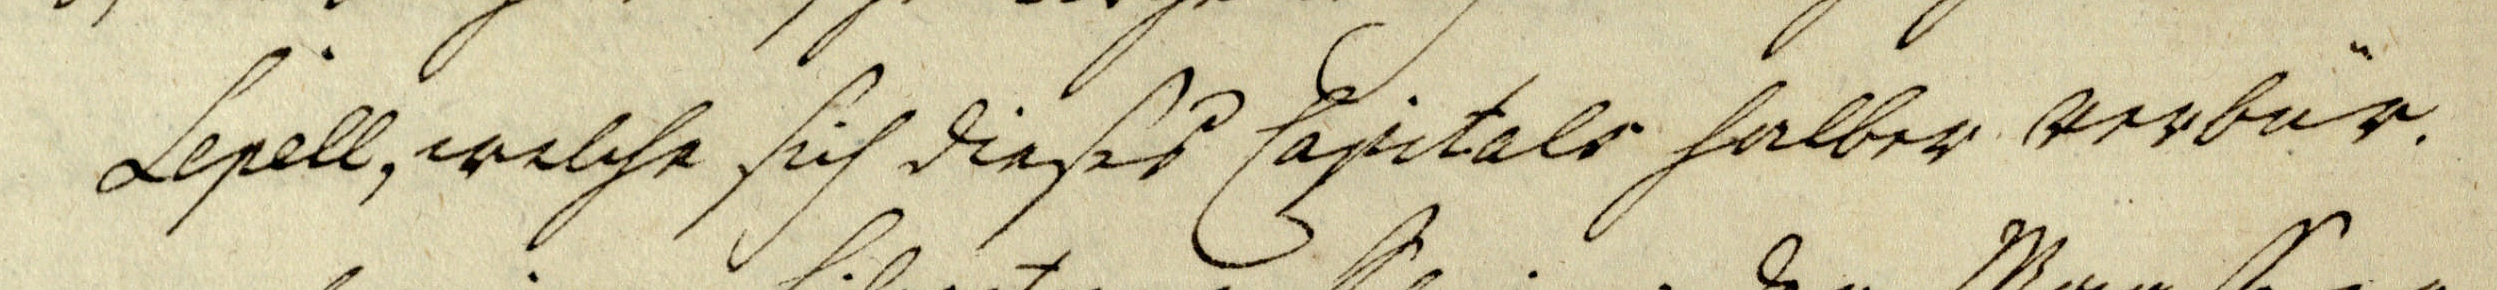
Lepell, welche sich dieses Capitals halber verbür¬
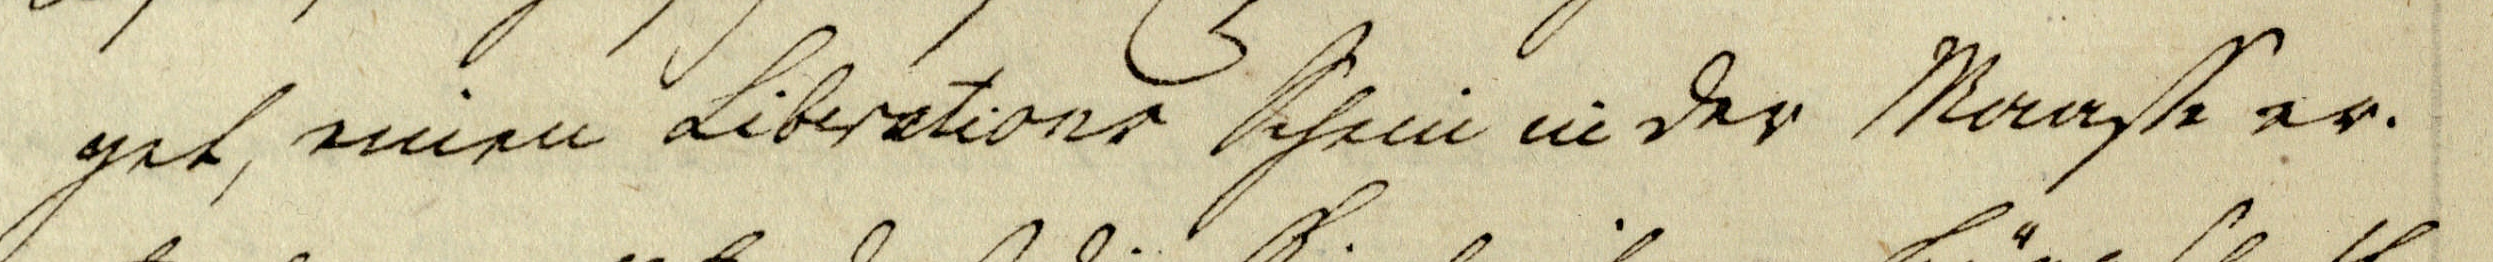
get, einen Liberations Schein in der Maasse er¬
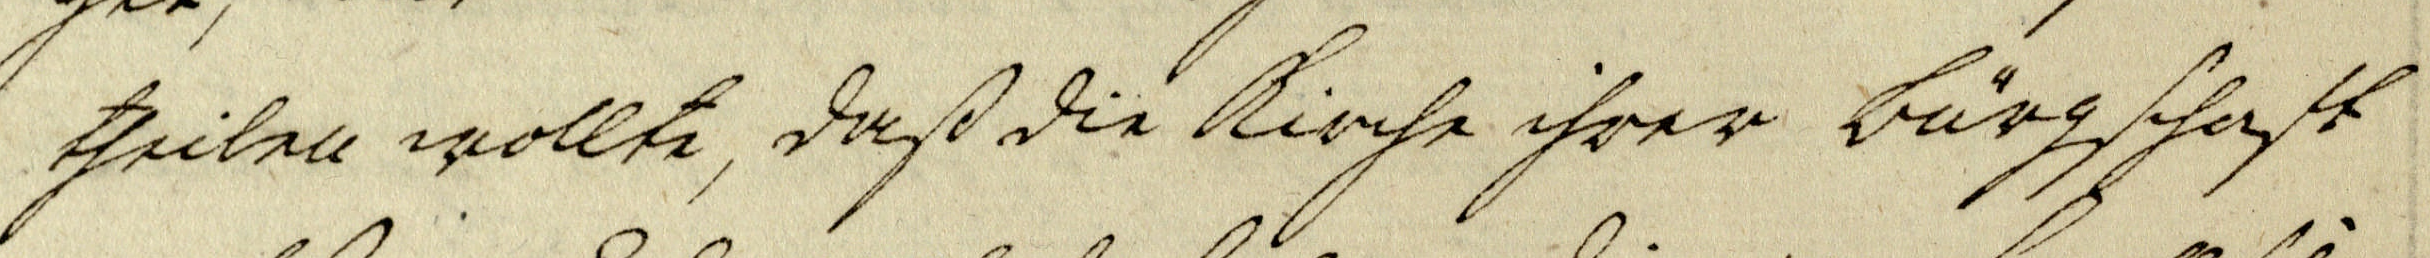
theilen wollte, daß die Kirche ihrer Bürgschaft
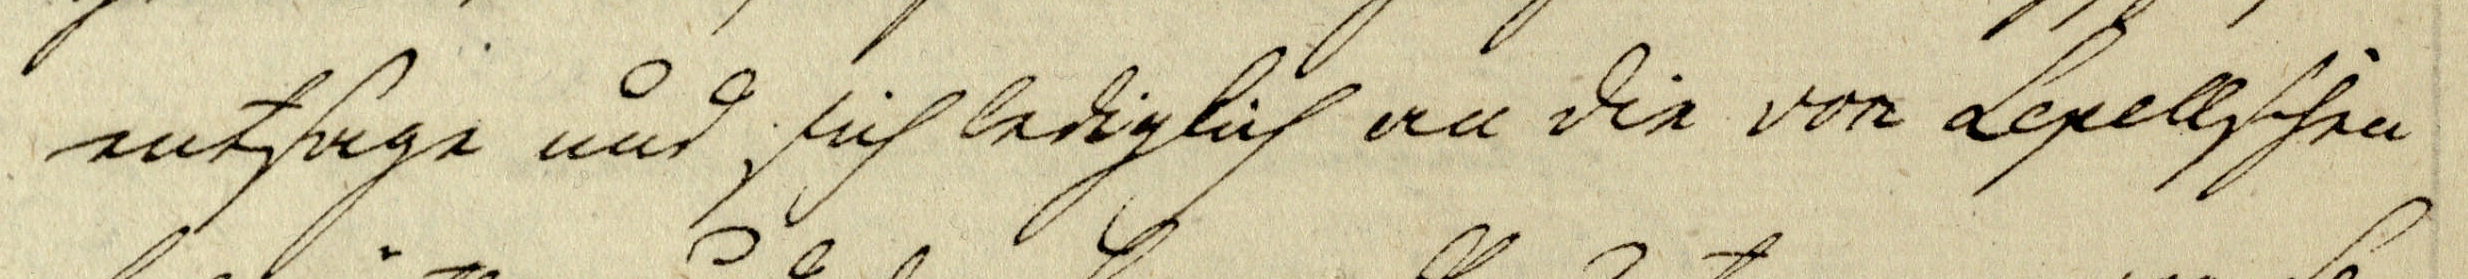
entsage und sich lediglich an die von Lepellschen
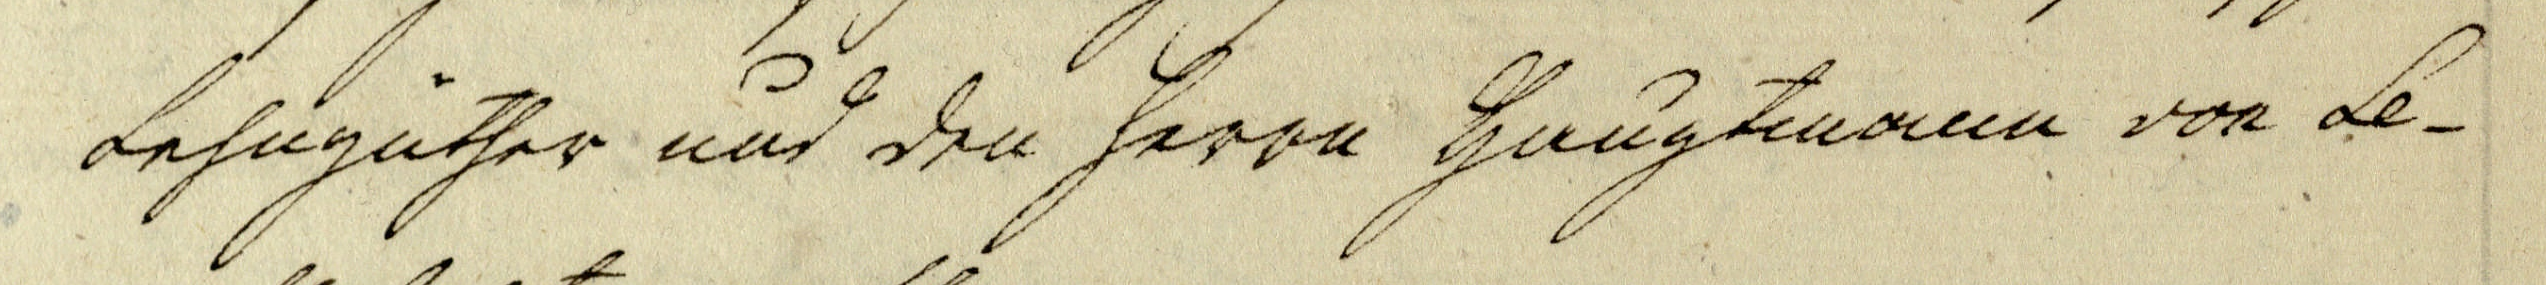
Lehngüther und den Herrn Hauptmann von Le¬
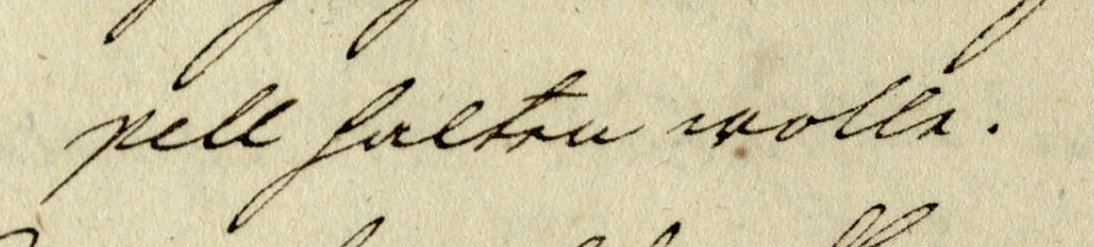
pell halten wolle.
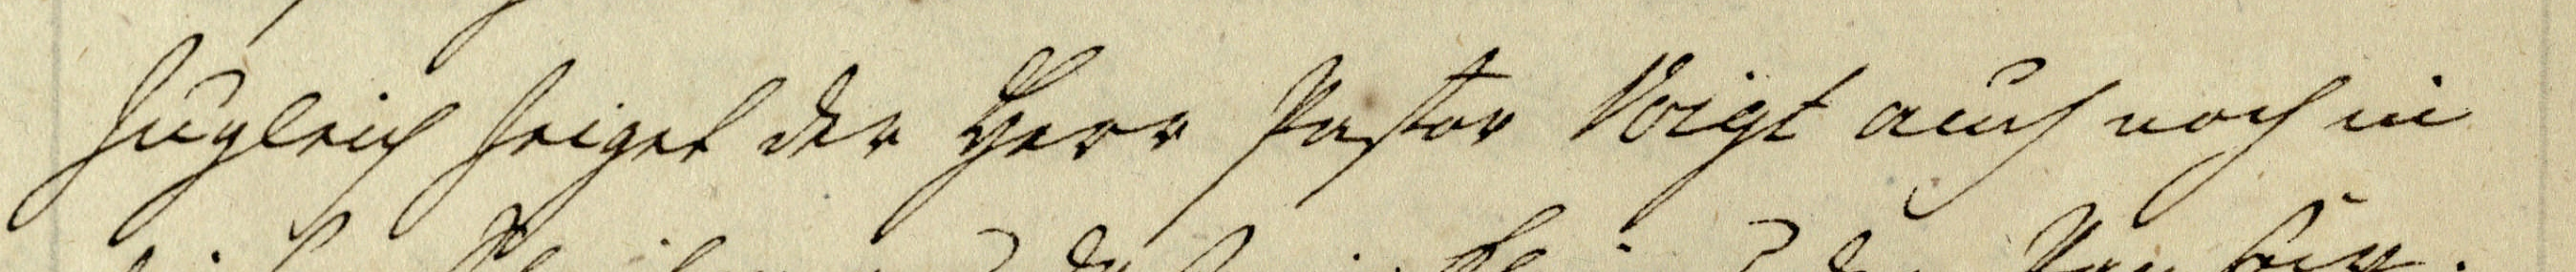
Zugleich zeiget der Herr Pastor Voigt auch noch in
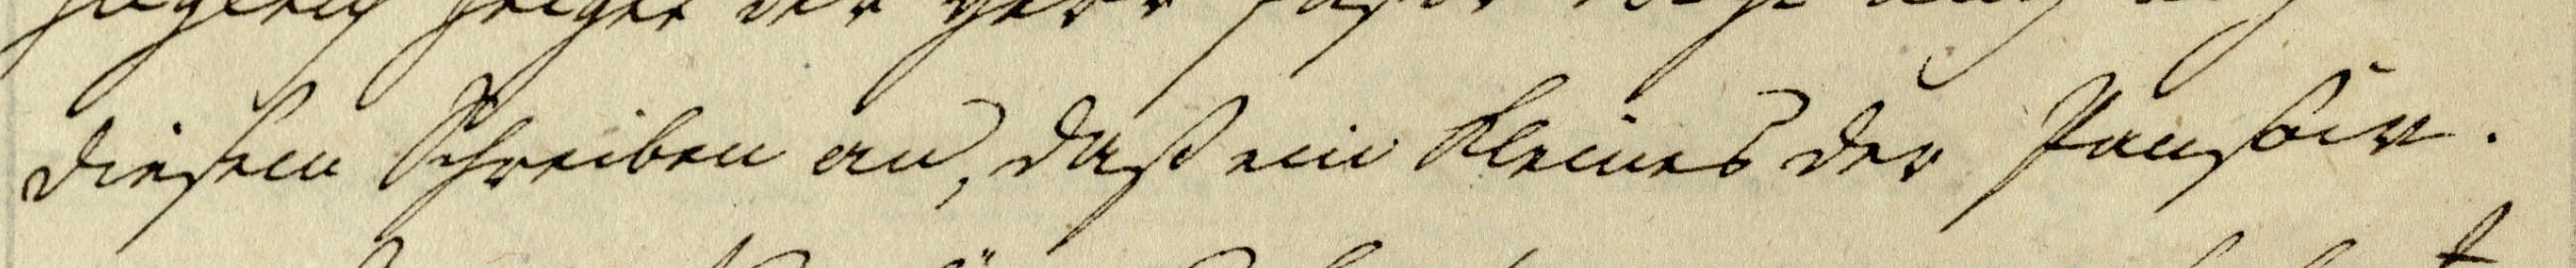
diesem Schreiben an, daß ein kleines der Pansow¬
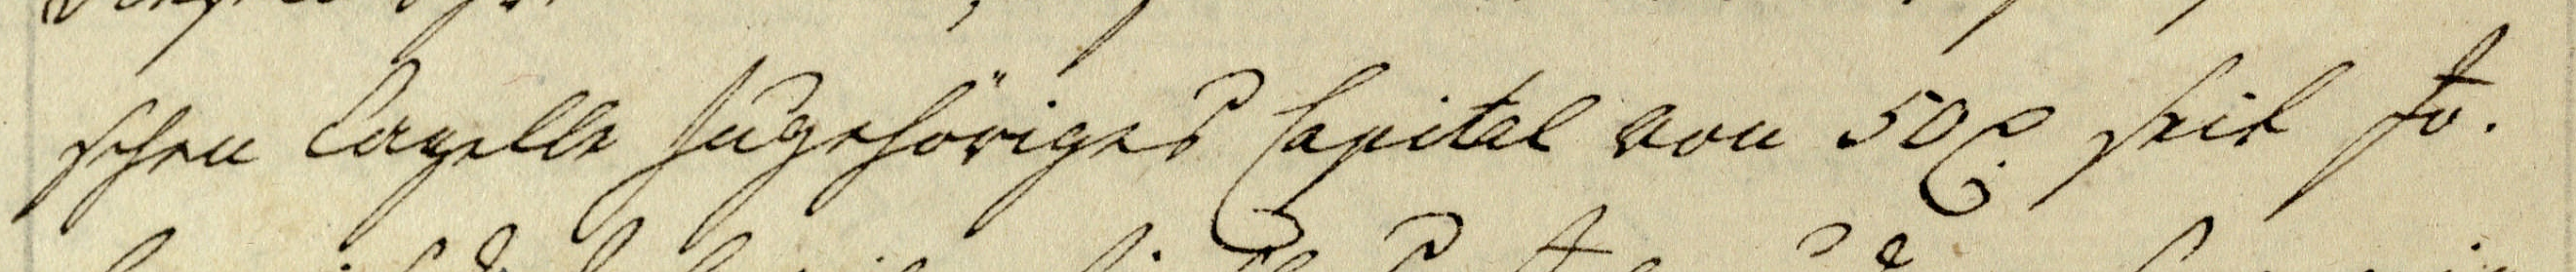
schen Capelle zugehöriges Capital von 50 l. seit Jo¬
